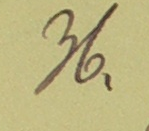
36
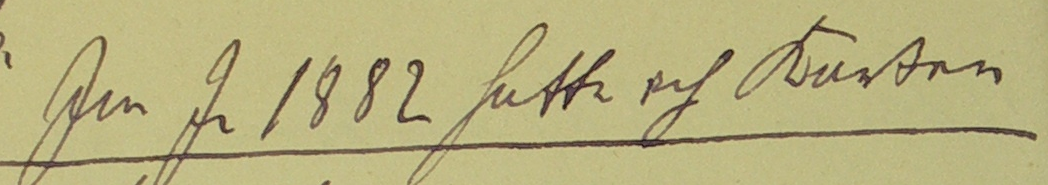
Im Jahr 1882 hatte ich Karten
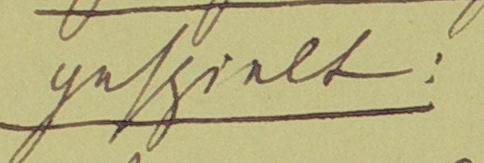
gespielt:
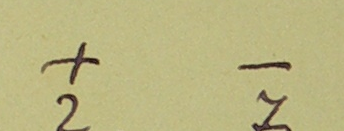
+ -
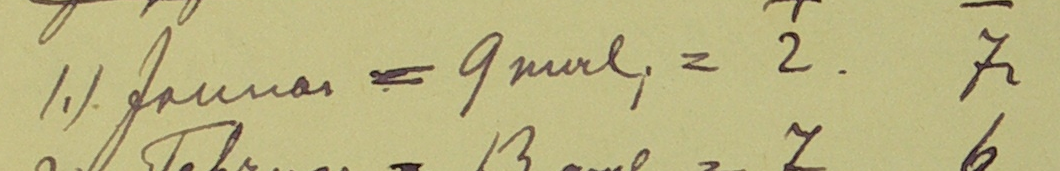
1.) Im Januar = 9 mal = 2 7
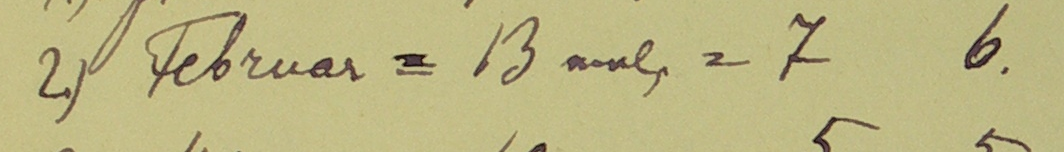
2.) Februar = 13 mal = 7 6
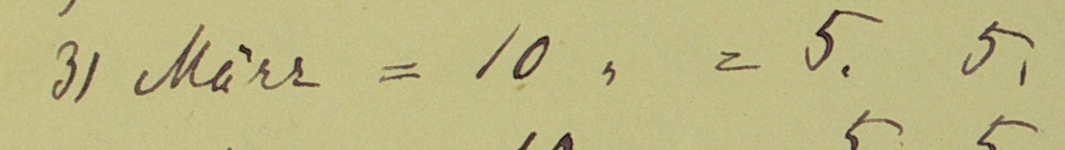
3.) März = 10 mal = 5 5
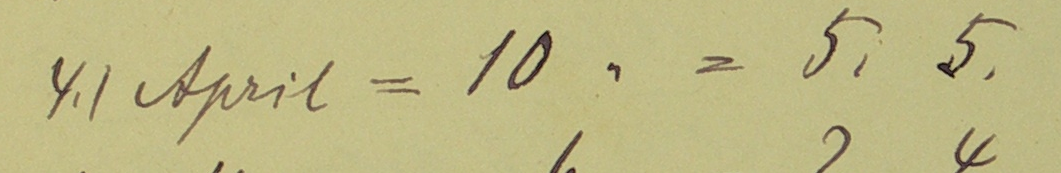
4.) April = 10 mal = 5 5
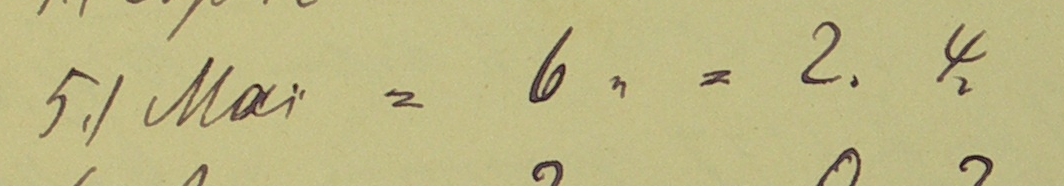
5.) Mai = 6 mal = 2 4
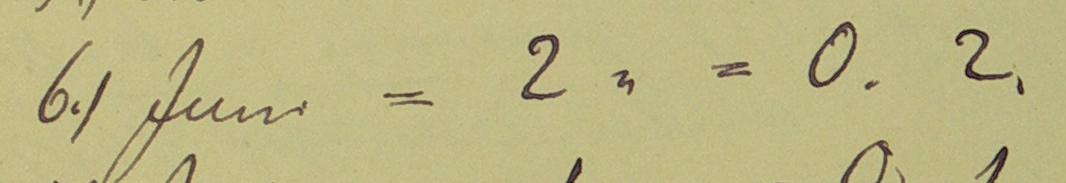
6.) Juni = 2 mal = 0 2
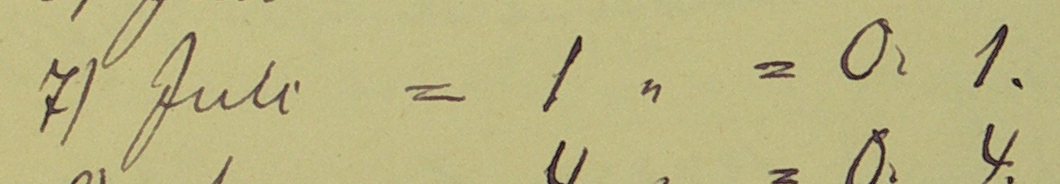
7.) Juli = 1 mal = 0 1
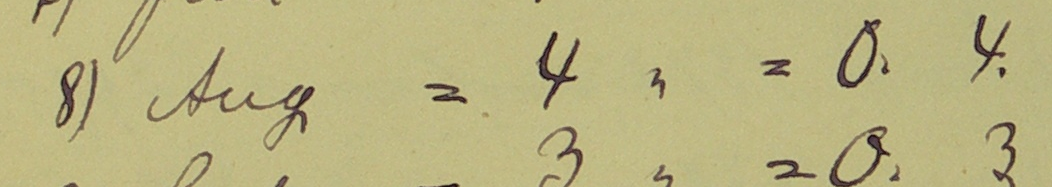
8.) August = 4 mal = 0 4
